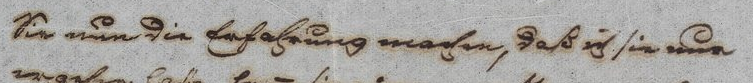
Sie nun die Erfahrung machen, daß ich Sie nur
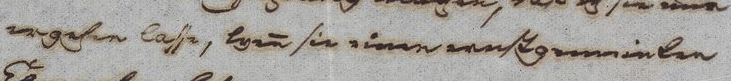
ergehen lasse, wenn sie einen ernstgemeinten
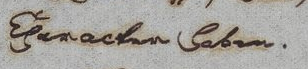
Character haben.
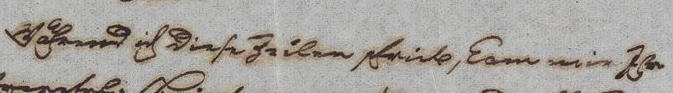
Während ich diese Zeilen schreibe, kam mir Ihr
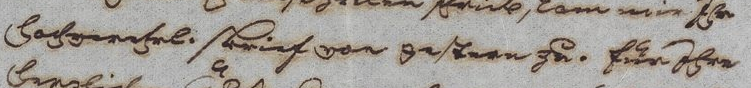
hochverehrl. Brief von gestern zu. Für Ihre
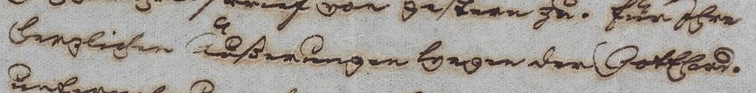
herzlichen Äußerungen wegen der Gotthard -
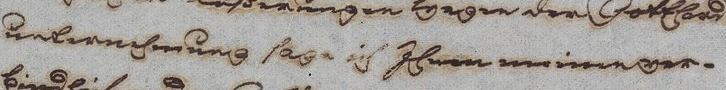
unternehmung sage ich Ihnen meinen ver-
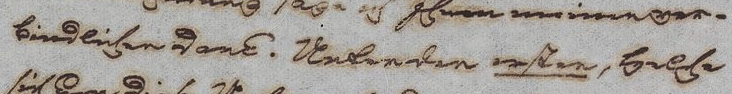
bindlichen Dank. Unter den ersten, welche
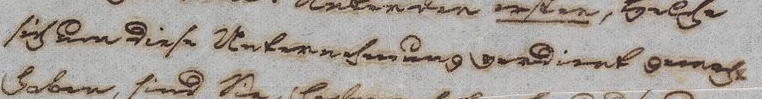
sich um diese Unternehmung verdient gemacht
